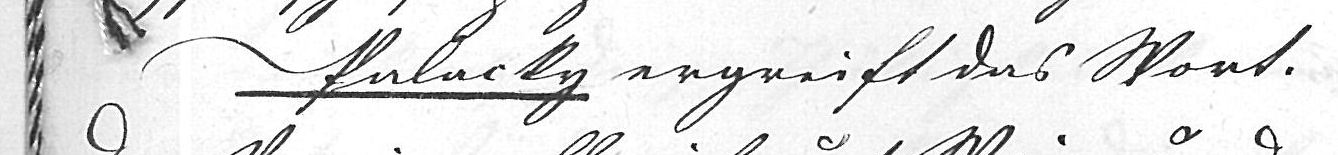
Palacky ergreift das Wort.
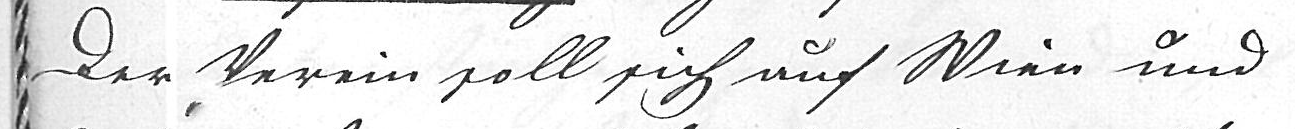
Der Verein soll sich auf Wien und
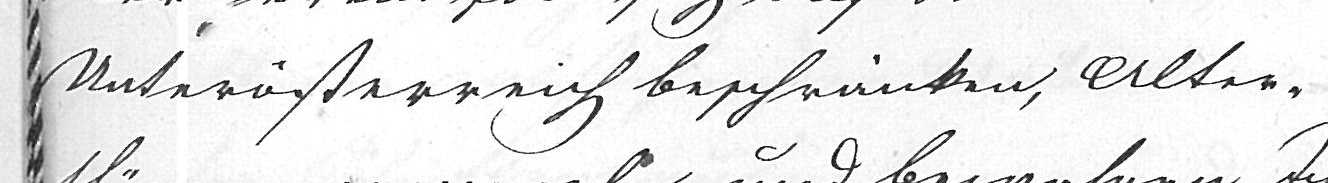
Unterösterreich beschränken, Alter-
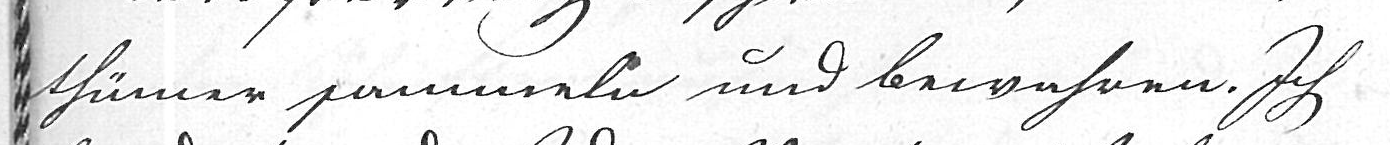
thümer sammeln und bewahren. Ich
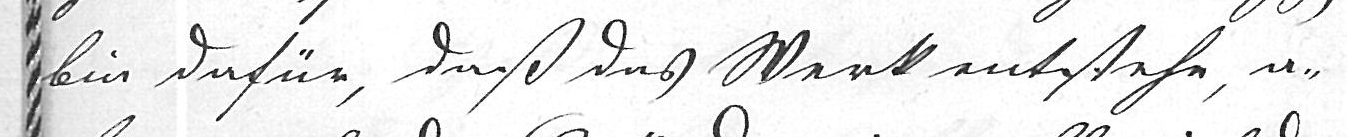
bin dafür, daß das Werk entstehe, a-
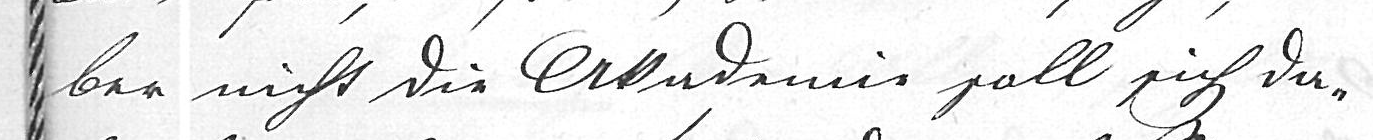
ber nicht die Akademie soll sich da-
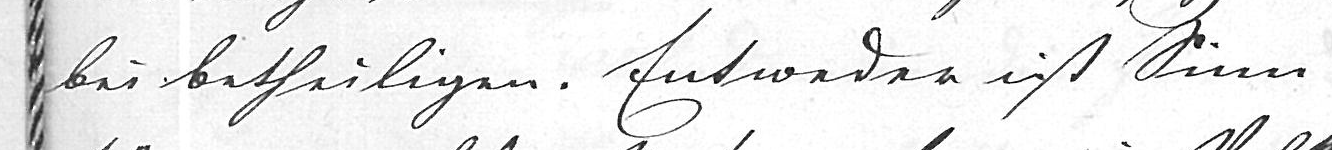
bei betheiligen. Entweder ist Sinn
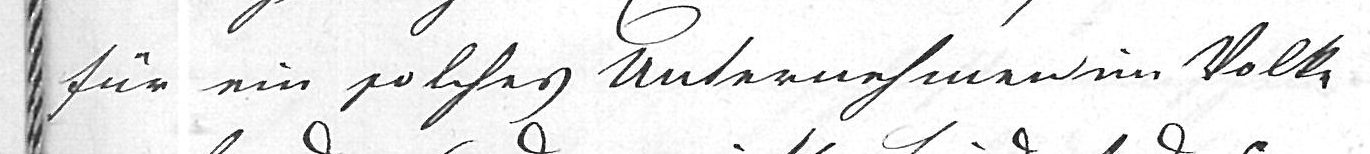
für ein solches Unternehmenin im Volk
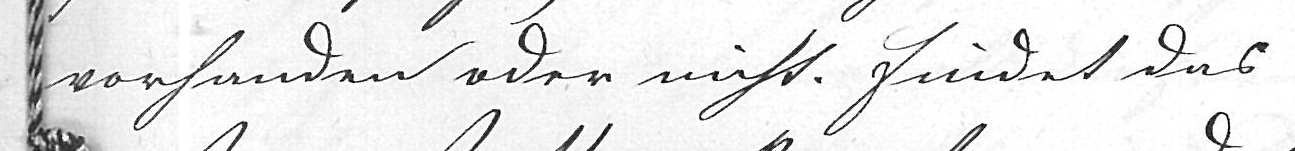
vorhanden oder nicht. Findet das
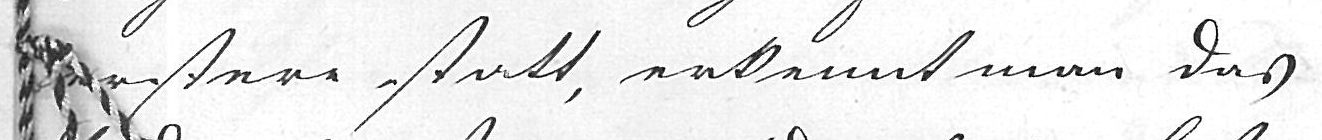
erstere statt, erkannt man das
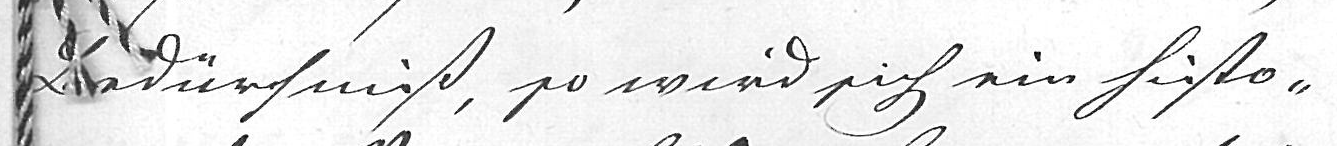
Bedürfniß, so wird sich ein histo-
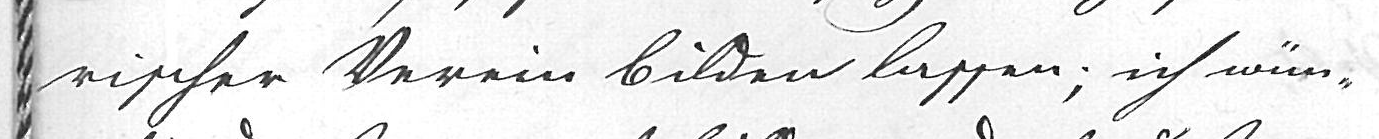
rischer Verein bilden lassen; ich wün-
